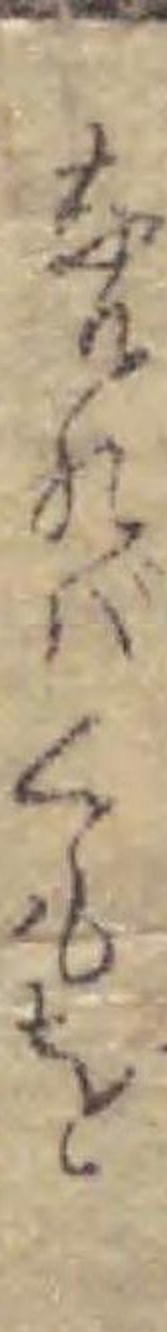なければくもを
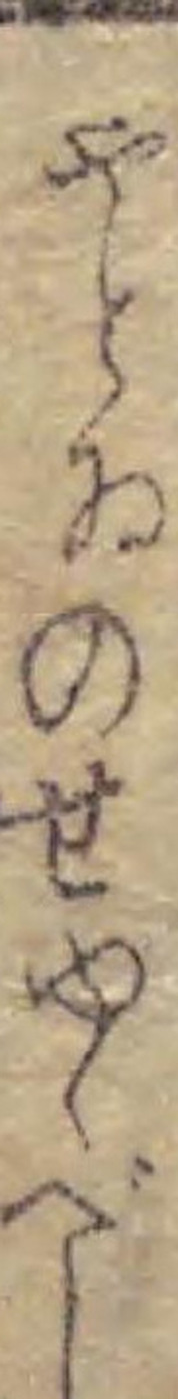やとゐのせゆくべしと
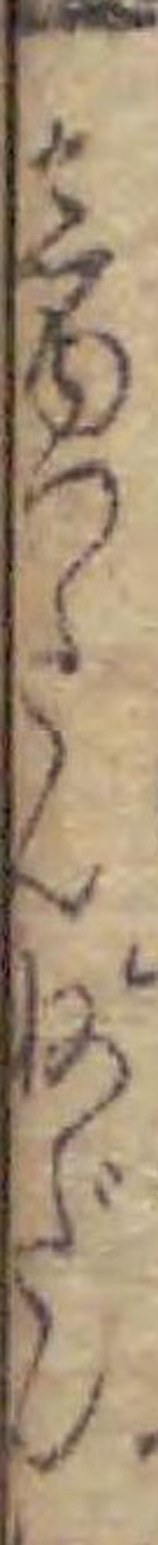しゆつたんねだんを
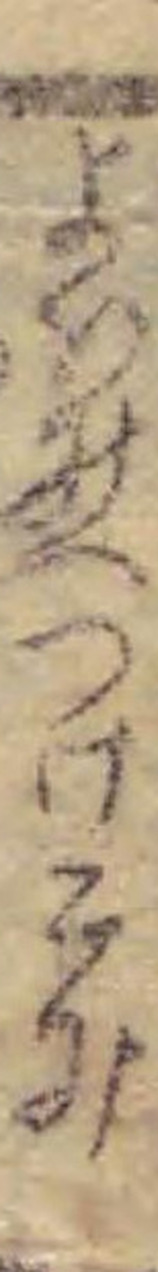よはみへつけこみ
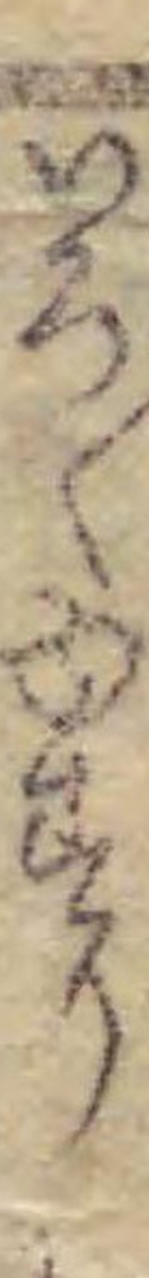いろ〳〵ゆすり
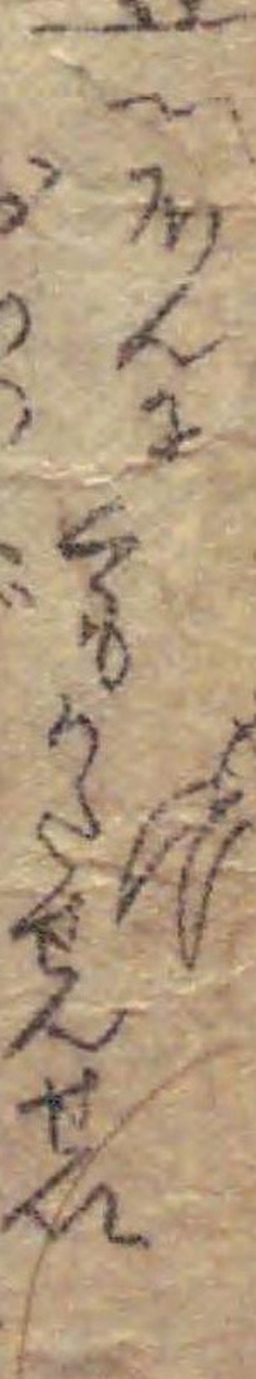雲かたのせんせい
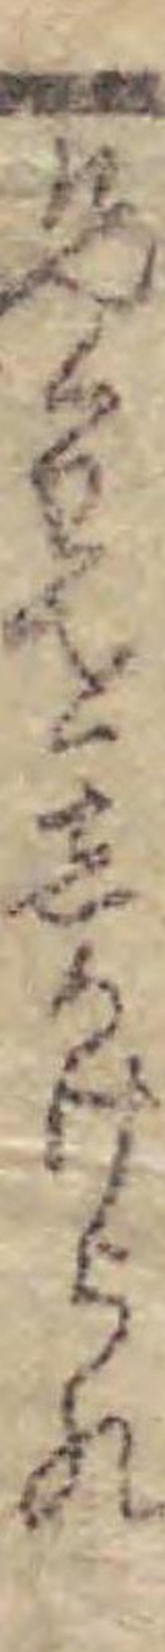けんくわをしかけられ
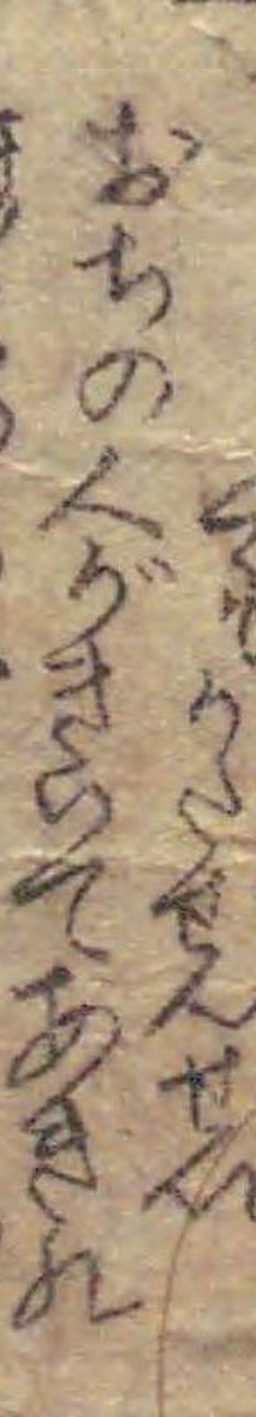おちの人がきいてあきれ
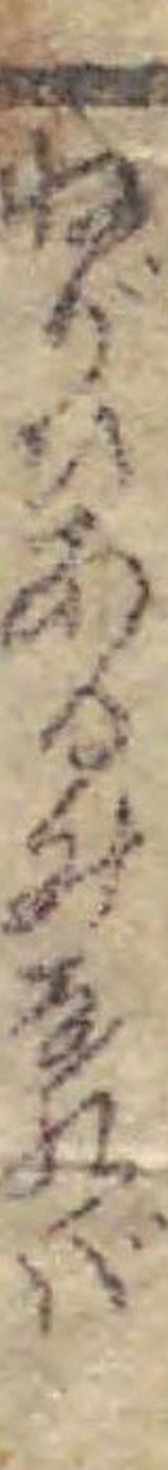ねがひあるみなれば
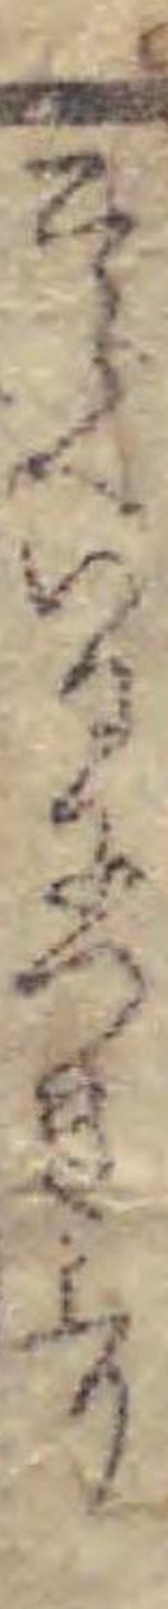こらへいるにつき上り
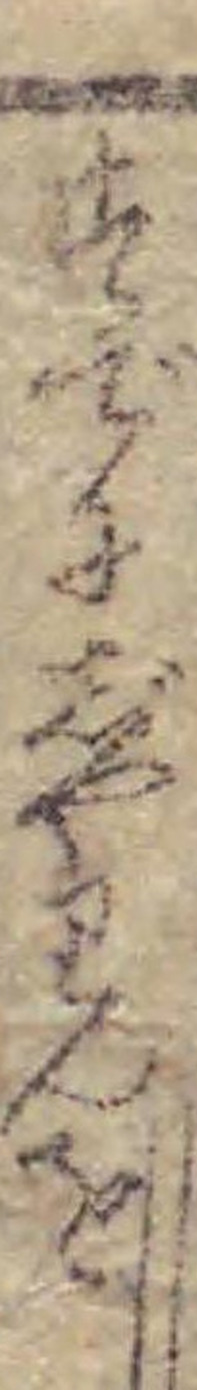すでにじやりんを
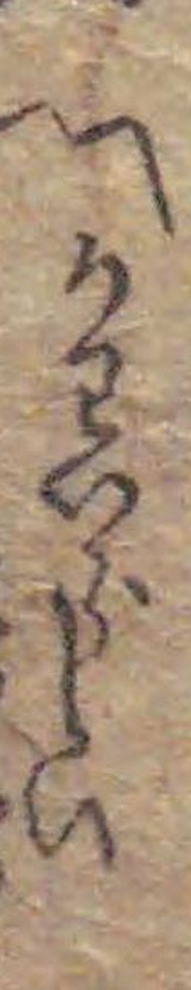〽かわいらしい
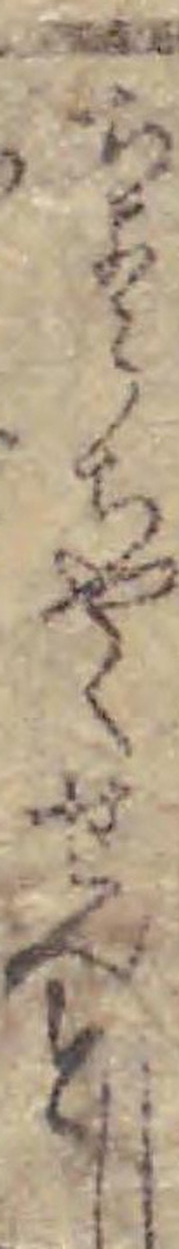ちようちやくせんと
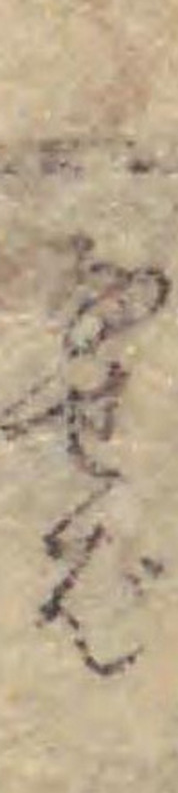なせば
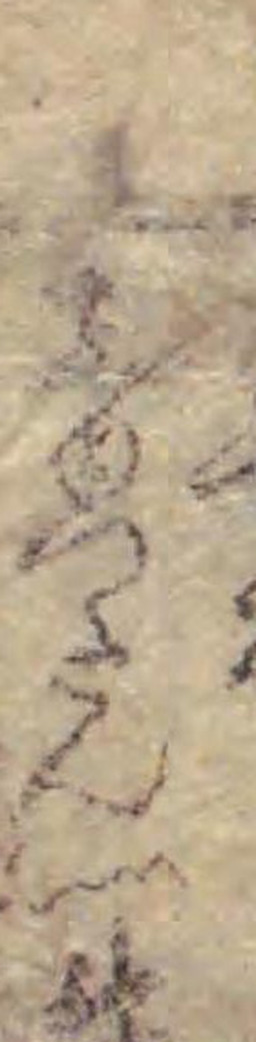しゆつたん
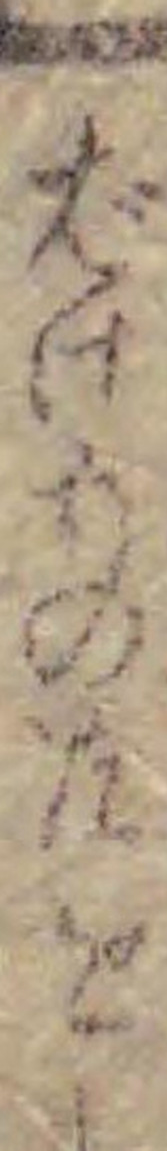ばけもの共を
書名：化物世界夜半嵐 : 3巻
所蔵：国立国会図書館 National Diet Library, JAPAN
